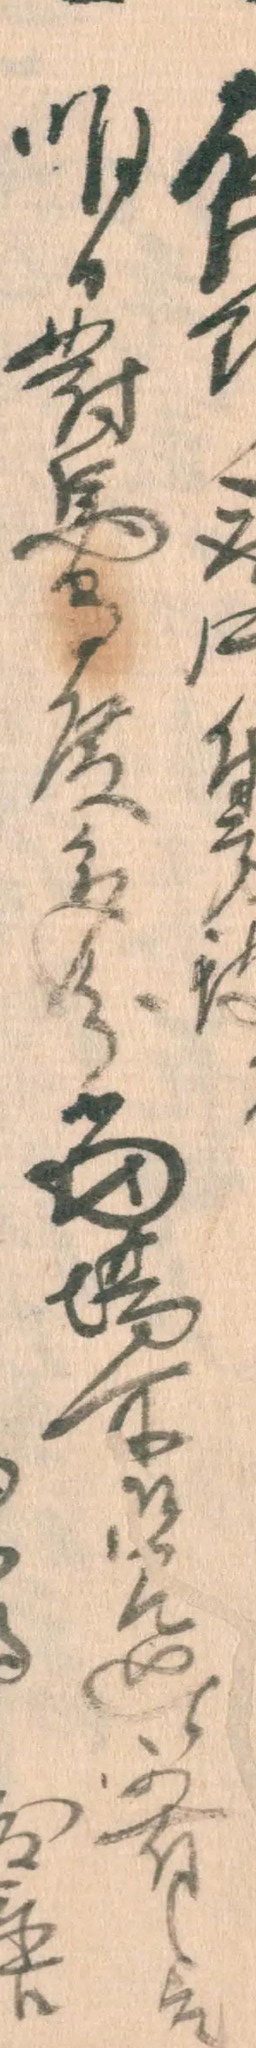一明日対馬守殿多分当場所見廻り可有之旨
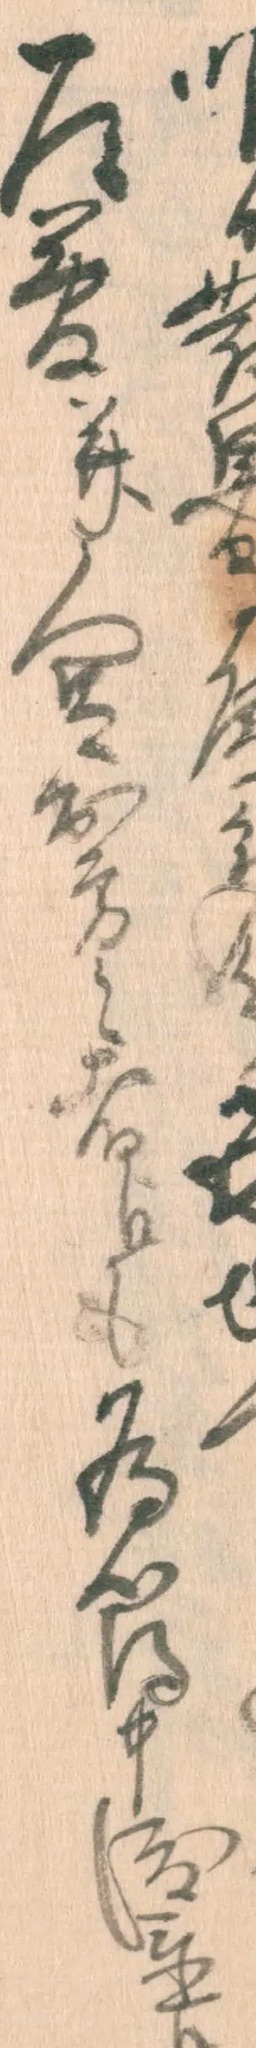左官幷人足出方之者えも為心得申渡置候
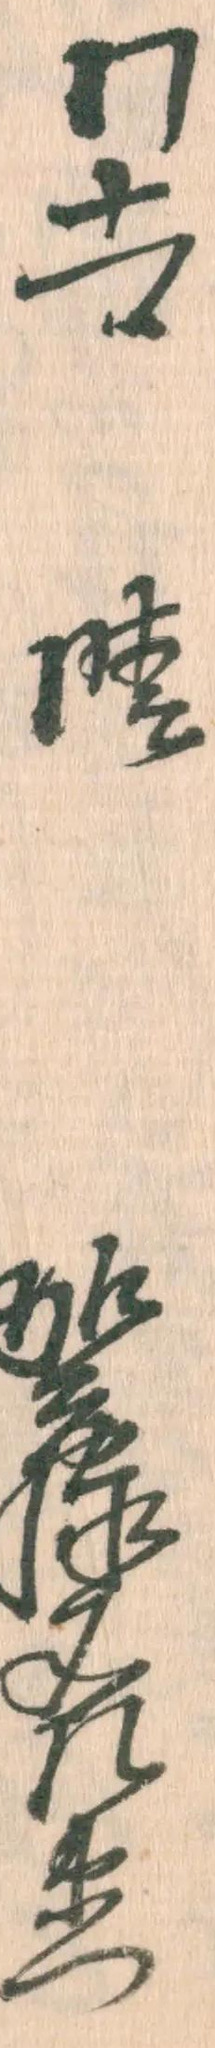同十一日晴加藤又左衛門
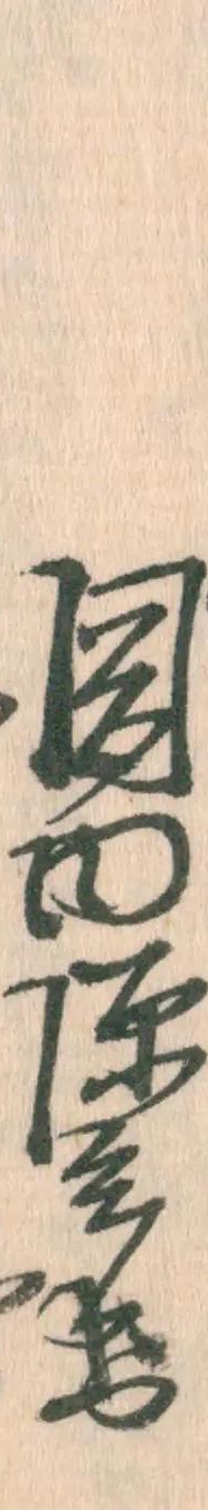岡田源兵衛
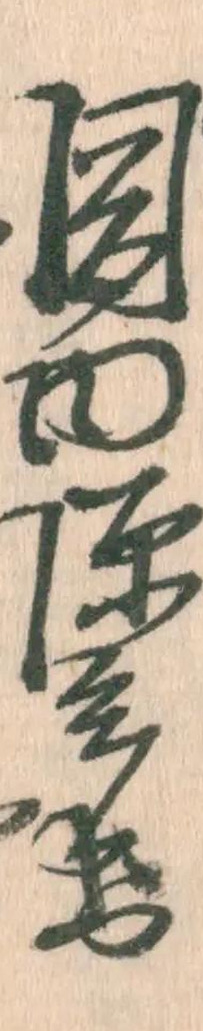岡田源兵衛

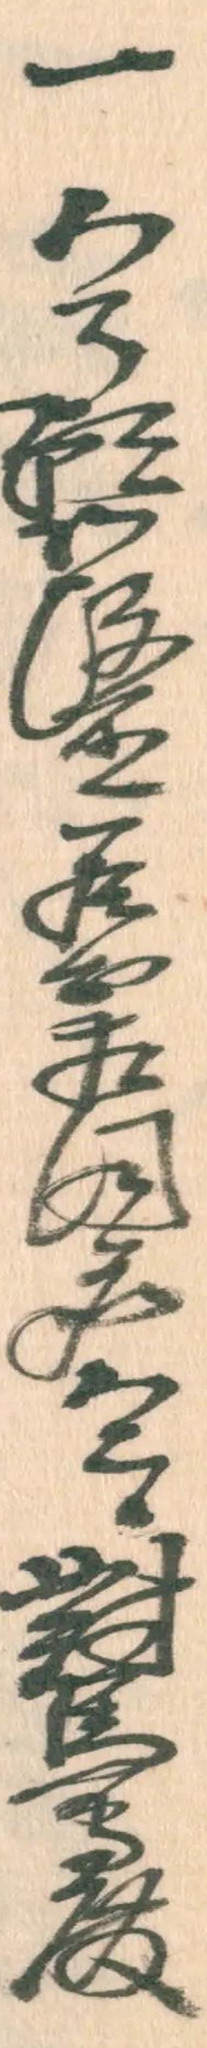一為御預御役所へ罷出相伺候処本日対馬守殿
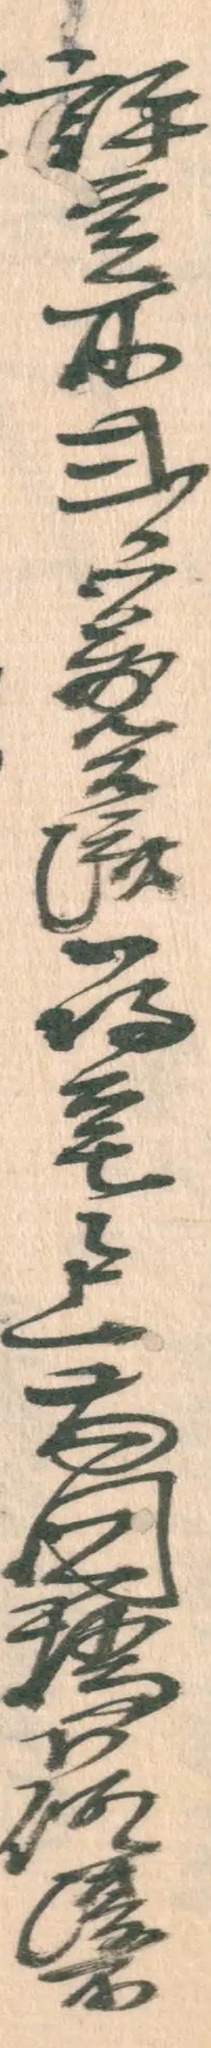評定所式日宜敷相済御帰宅之上両国橋御修復所
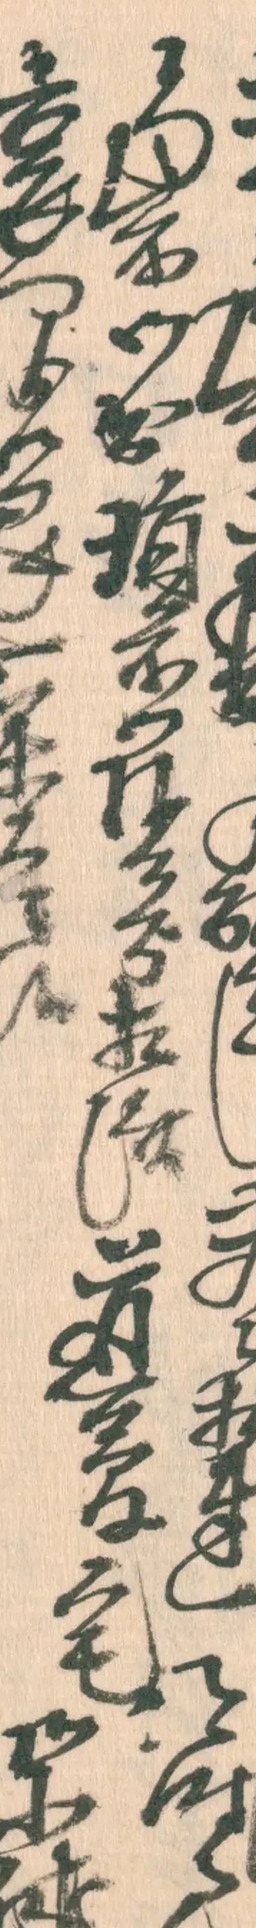当所御出損所御見分相済道菅宅御小休
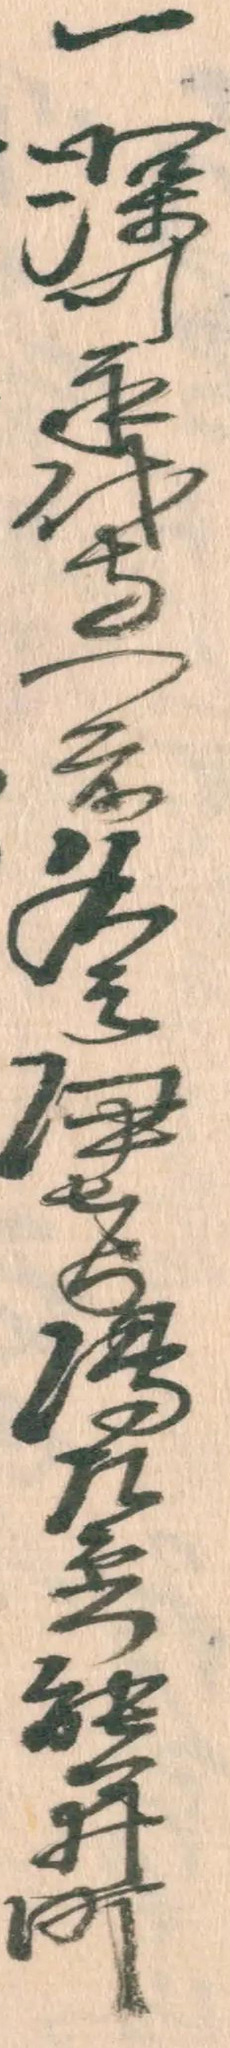一深川永代寺門前名主伊七郎得左衛門熊井町
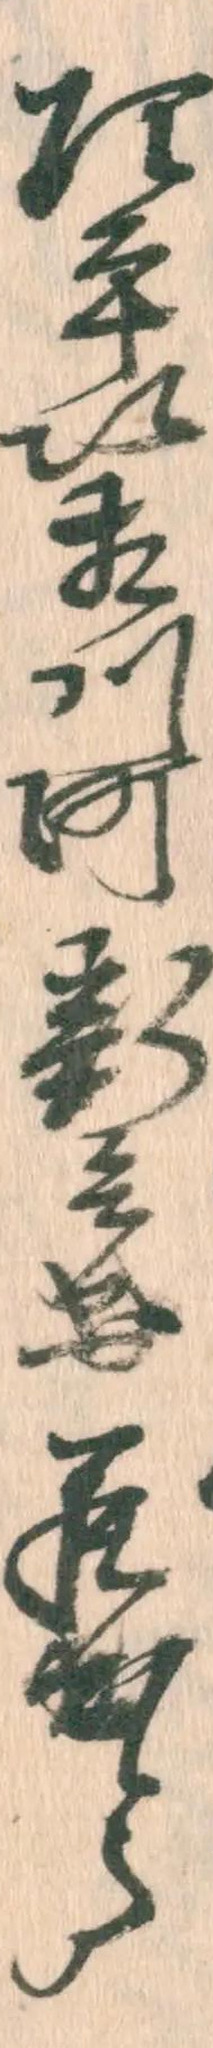理平次相川町新兵衛罷出候事
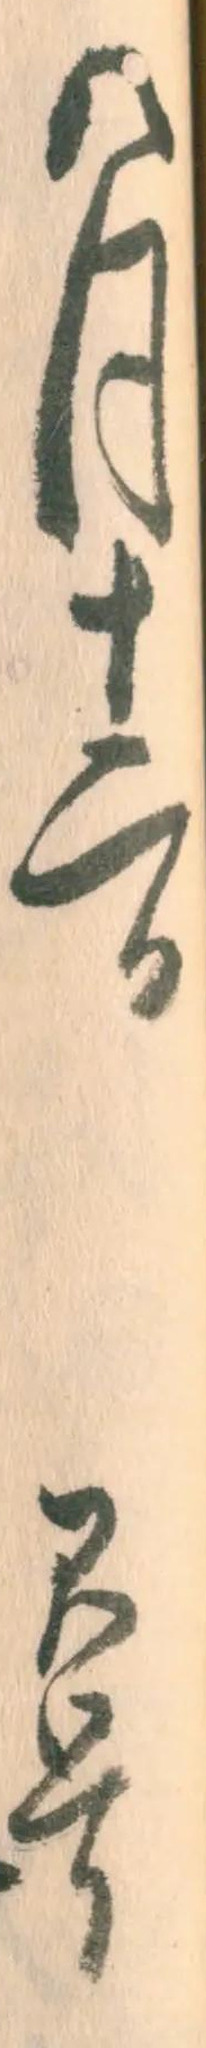八月十二日見廻り
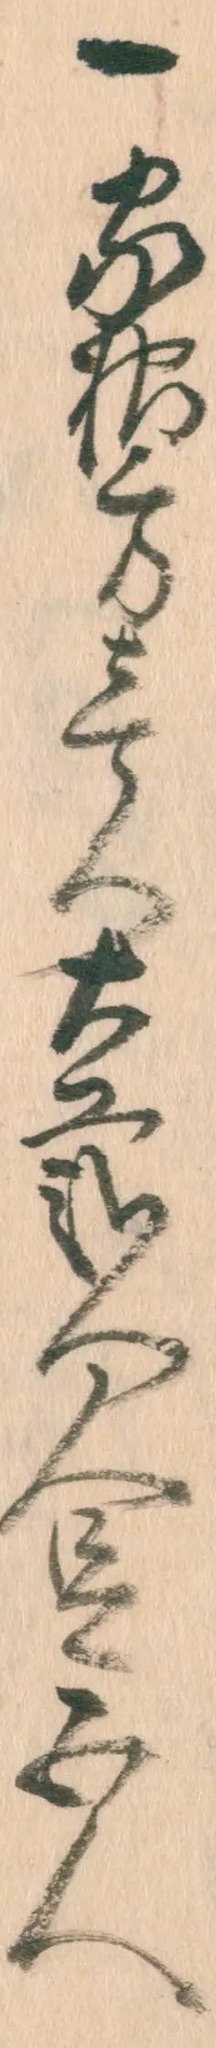一家根方三人大工弐人人足五人
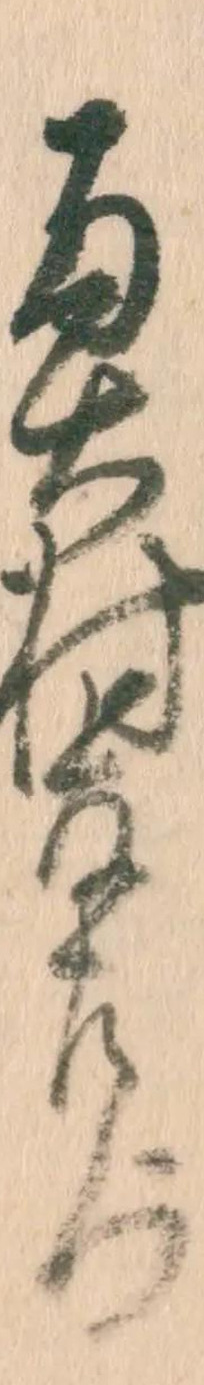奥村富左衛門

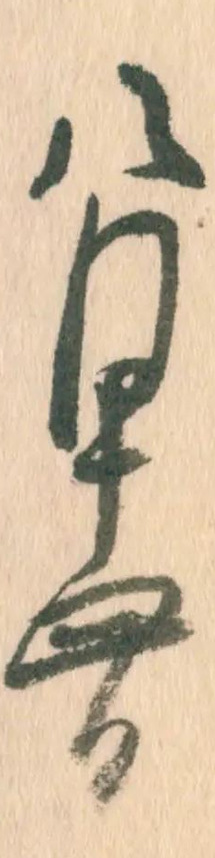八月十四日
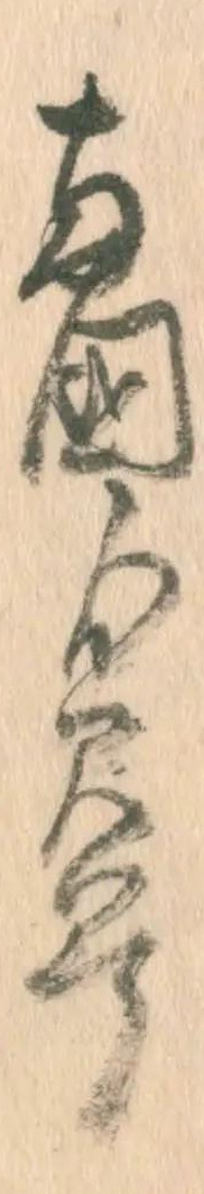両国ゟ見廻
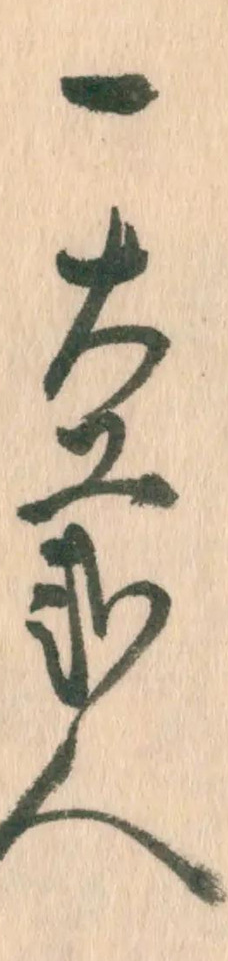一大工弐人
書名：三十三間堂. [2]
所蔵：国立国会図書館 National Diet Library, JAPAN
